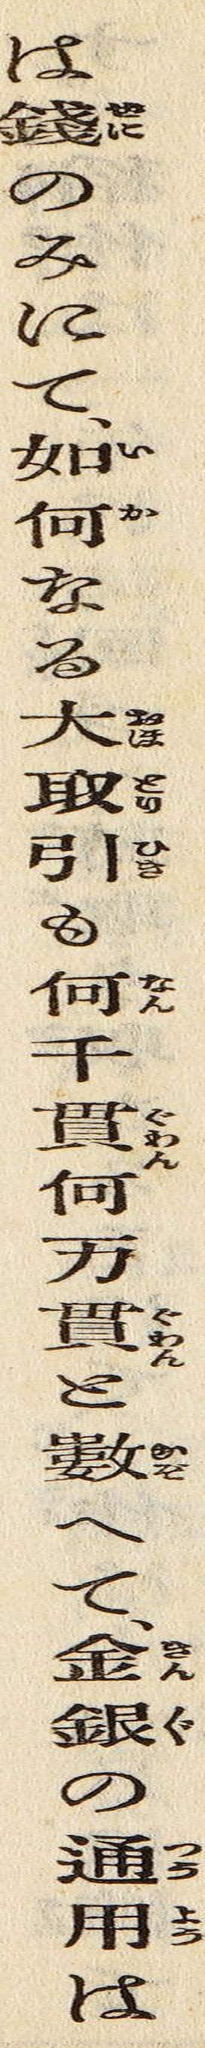は銭のみにて、如何なる大取引も何千貫何万貫と数へて、金銀の通用は
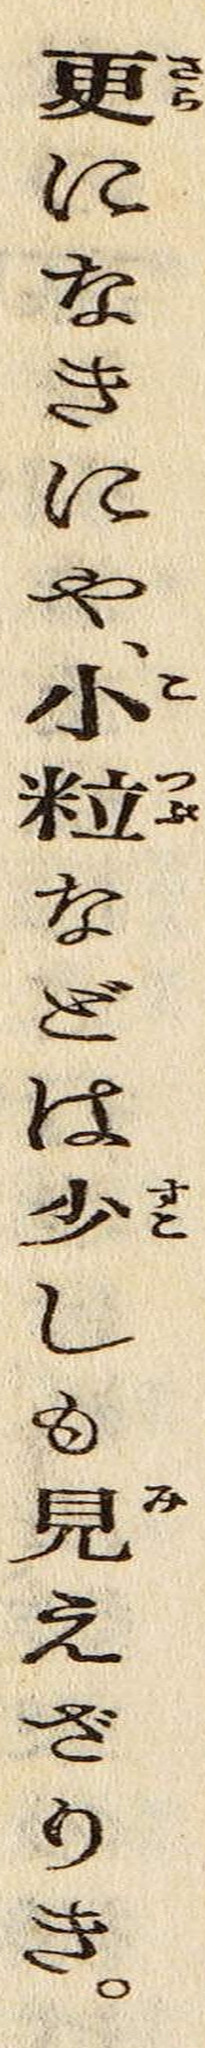更になきにや、小粒などは少しも見えざりき。
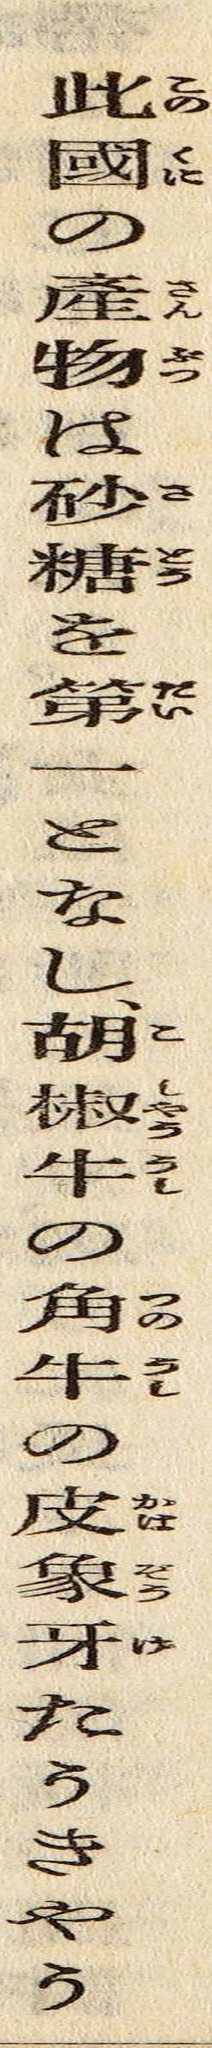此国の産物は砂糖を第一となし、胡椒牛の角牛の皮象牙たうきやう
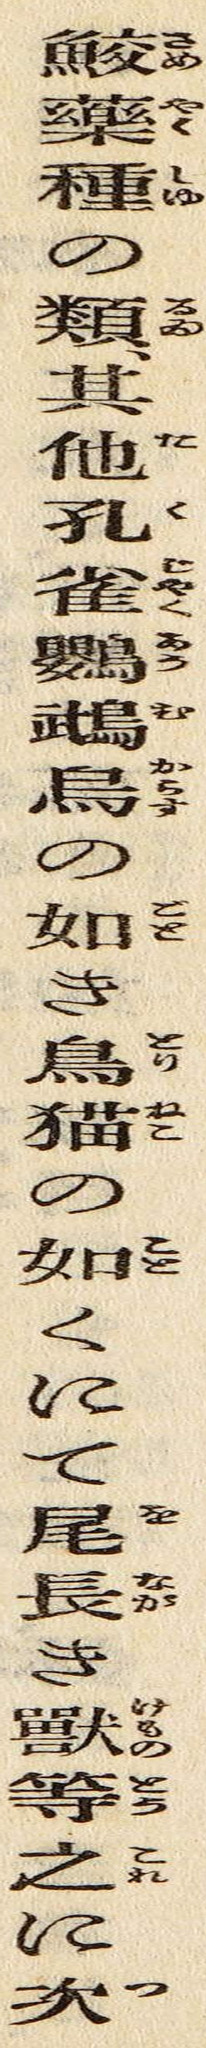鮫薬種の類、其他孔雀鸚鵡烏の如き鳥猫の如くにて尾長き獣等之に次
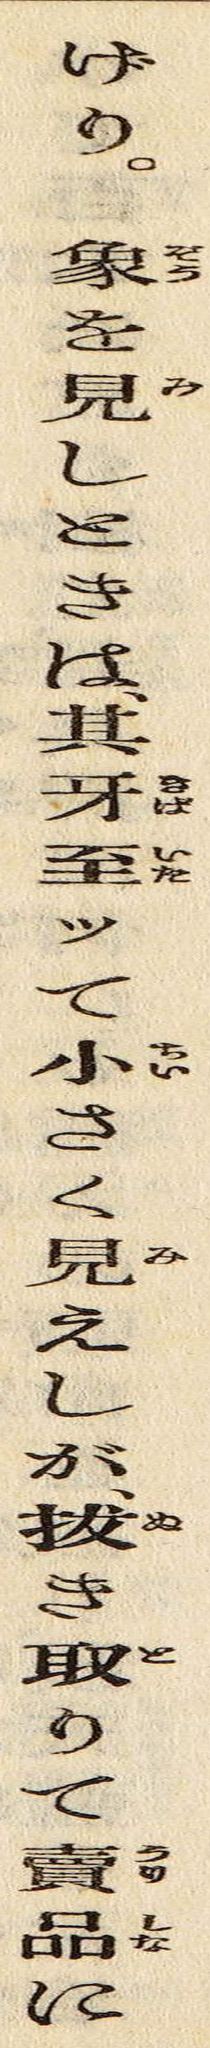げり。象を見しときは、其牙至ツて小さく見えしが、抜き取りて売品に
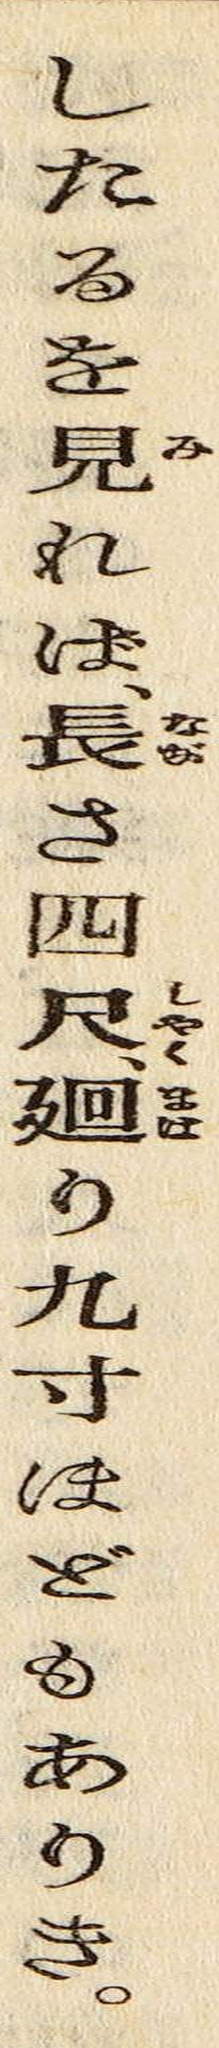したるを見れば、長さ四尺、廻り九寸ほどもありき。
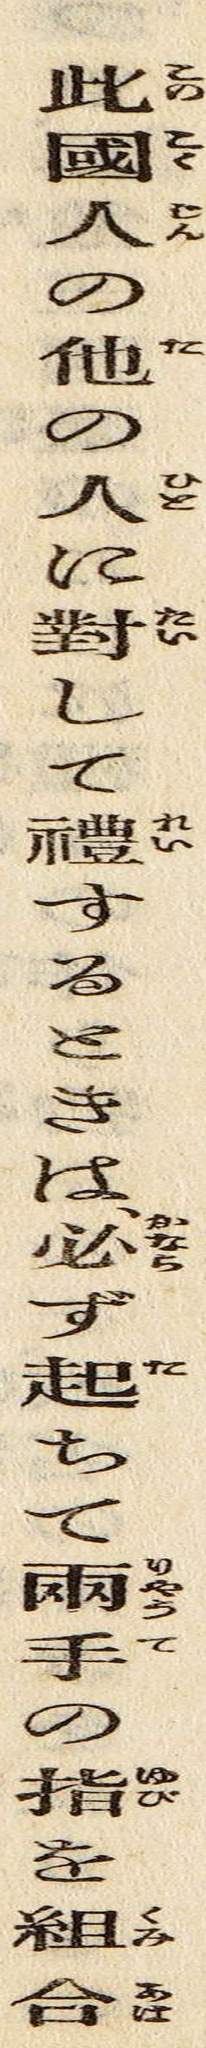此国人の他の人に対して礼するときは、必ず起ちて両手の指を組合
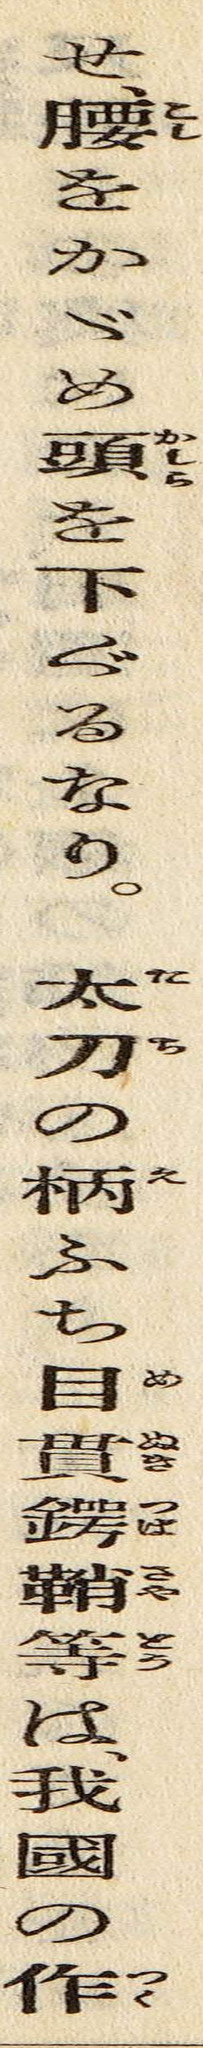せ、腰をかゞめ頭を下ぐるなり。太刀の柄ふち目貫鍔鞘等は、我国の作
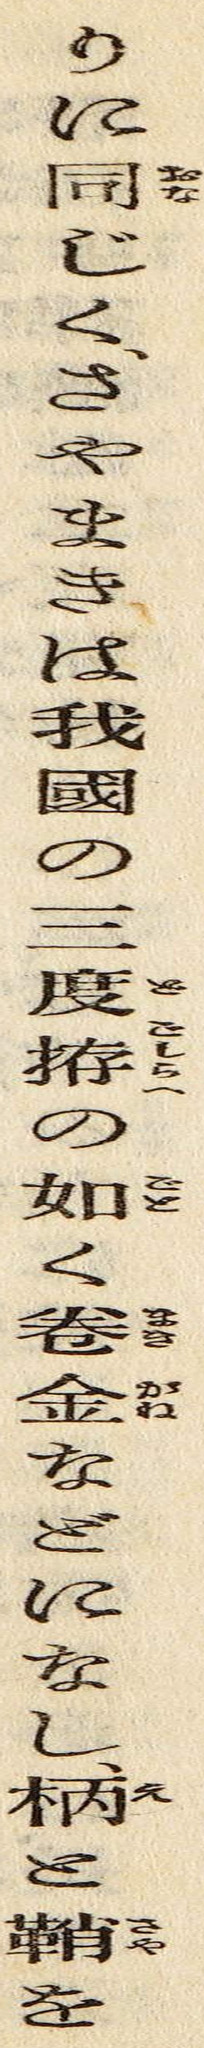りに同じく、さやまきは我国の三度拵の如く巻金などになし、柄と鞘を
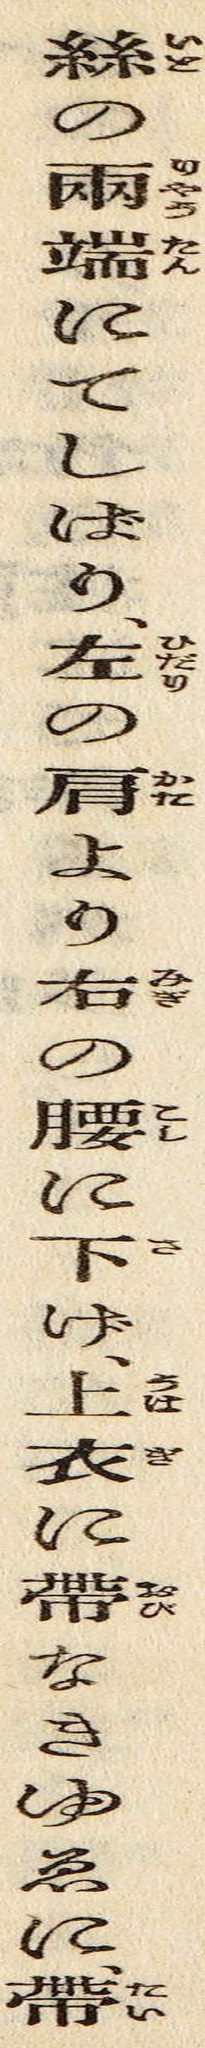糸の両端にてしばり、左の肩より右の腰に下げ、上衣に帯なきゆゑに、帯
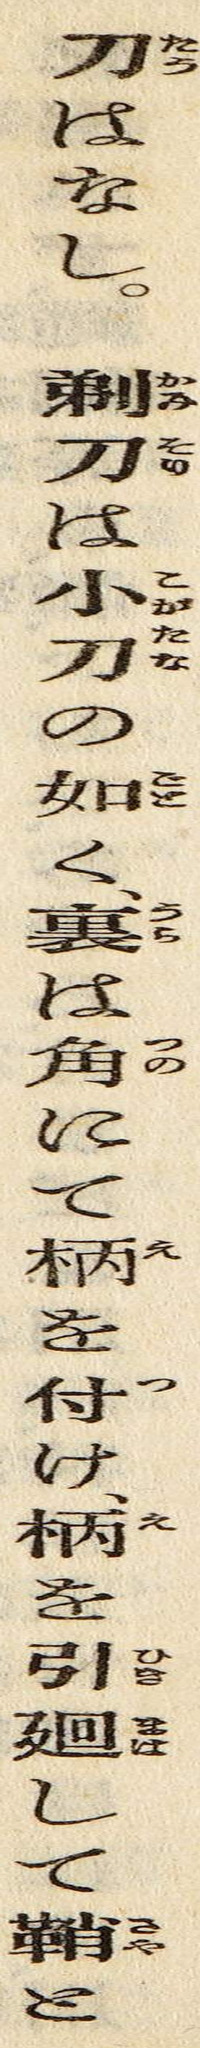刀はなし。剃刀は小刀の如く、裏は角にて柄を付け、柄を引廻して鞘と
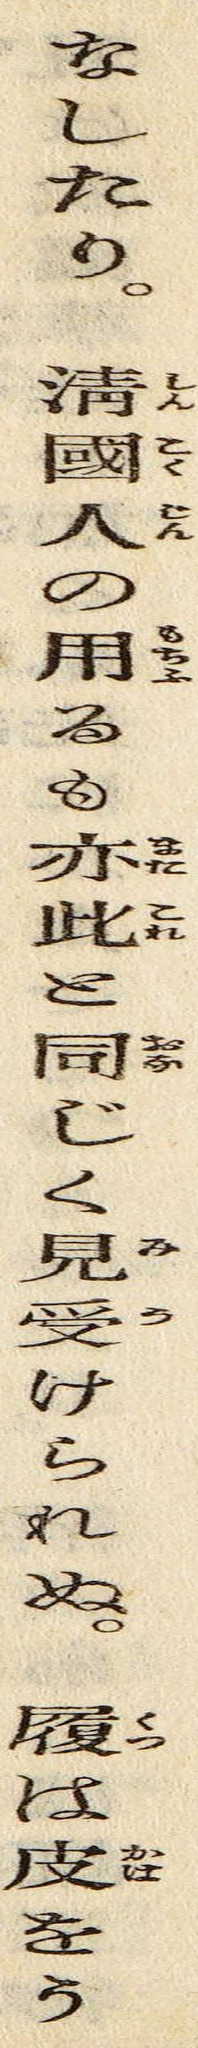なしたり。清国人の用るも亦此と同じく見受けられぬ。履は皮をう
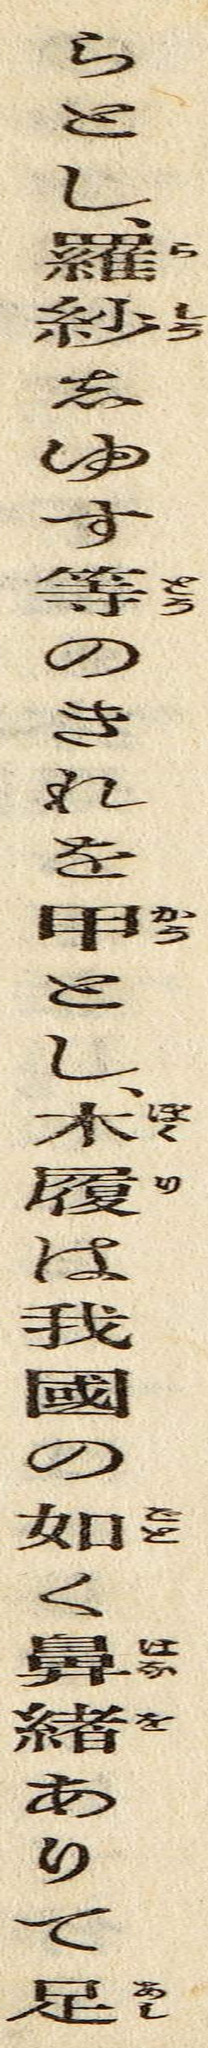らとし、羅紗しゆす等のきれを甲とし、木履は我国の如く鼻緒ありて足

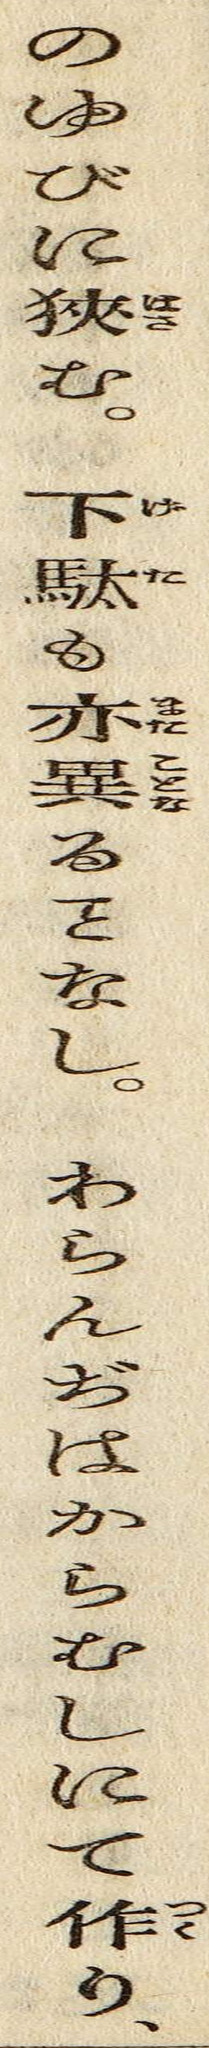のゆびに挟む。下駄も亦異ることなし。わらんぢはからむしにて作り、
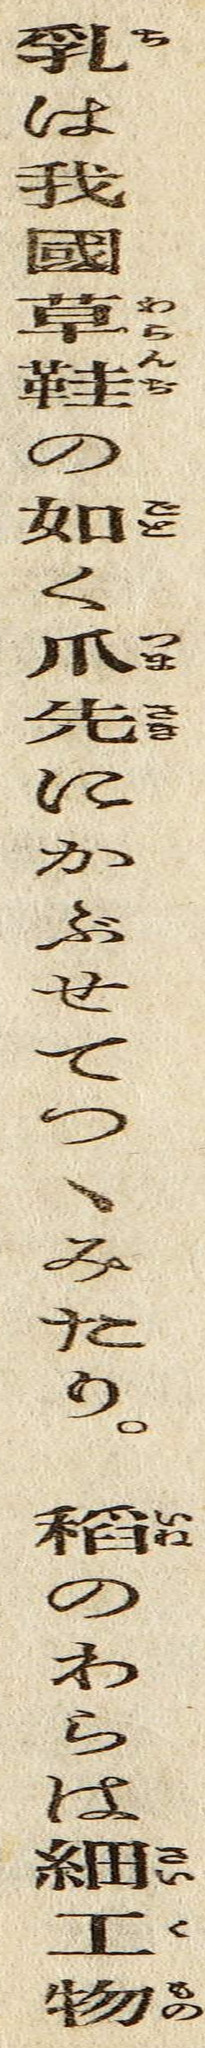乳は我国草鞋の如く爪先にかぶせてつヽみたり。稲のわらは細工物
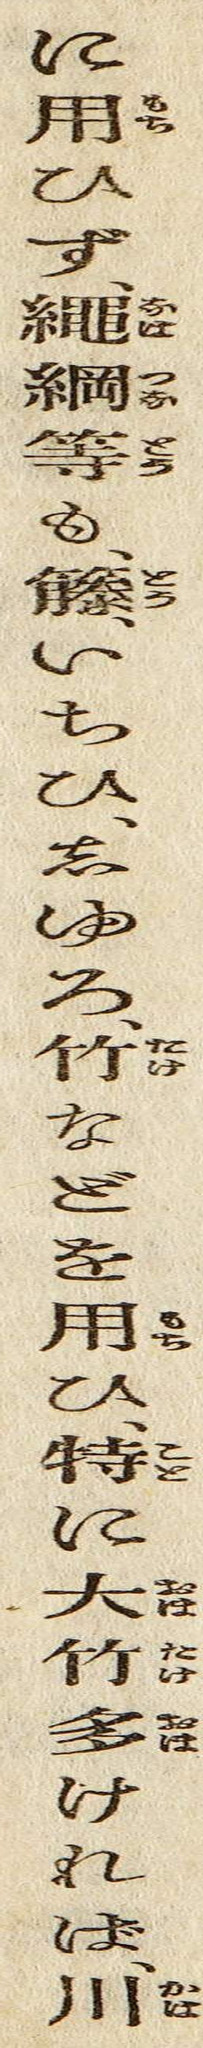に用ひず、縄綱等も、籐、いちひ、しゆろ、竹などを用ひ、特に大竹多ければ、川
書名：日本漂流譚
